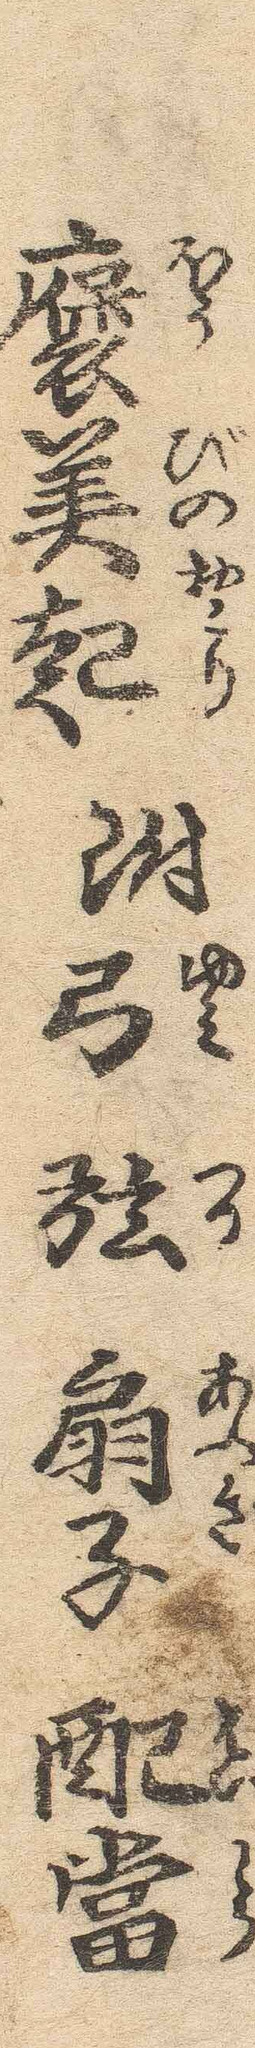褒美起附弓弦扇子配当
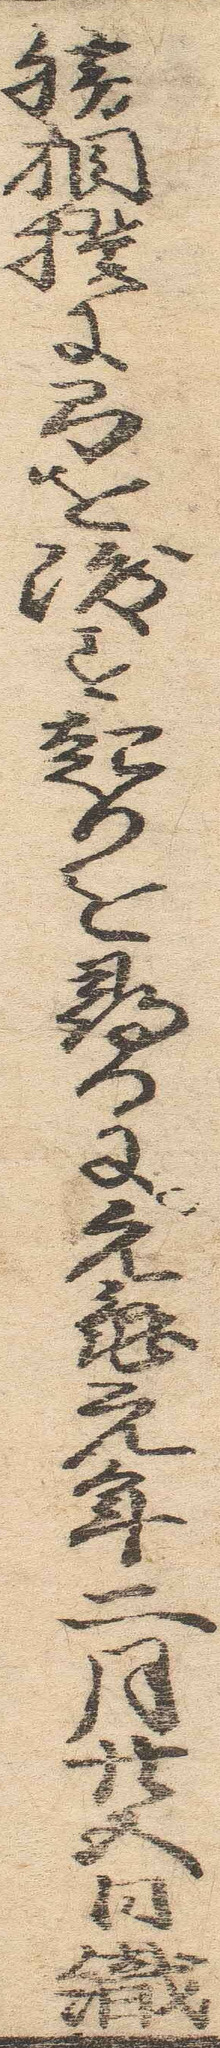勝相撲に弓を渡す起りを尋るに元亀元年二月廿五日織
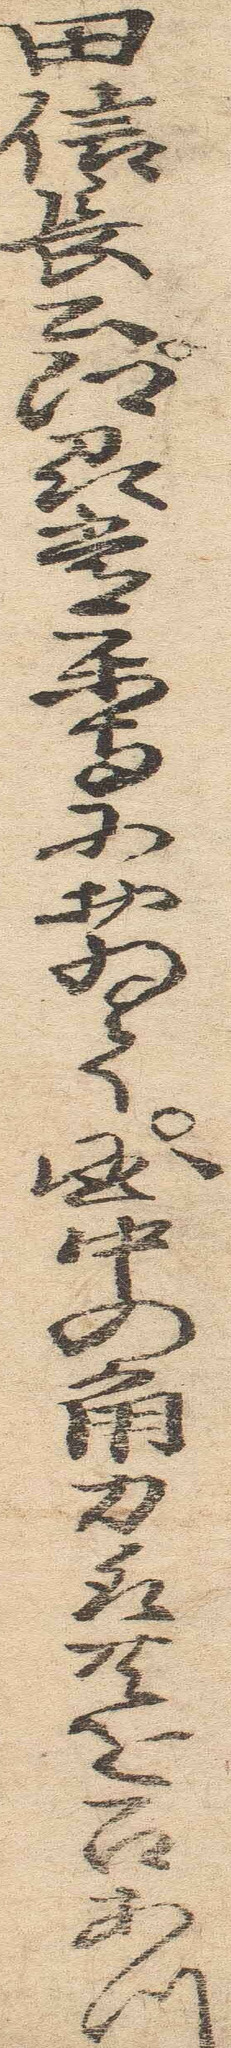田信長公。江州堂楽寺におゐて。国中の角力取を召あつ
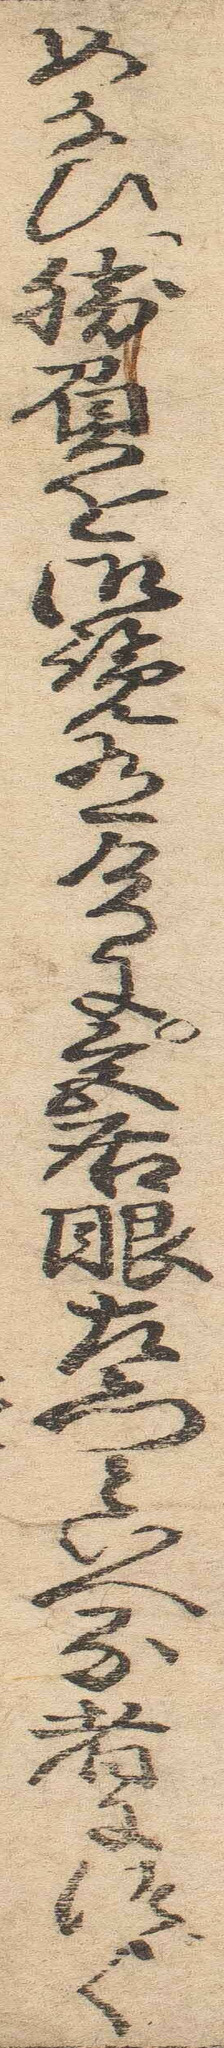め給ひ。勝負を御覧有けるに。宮居眼右衛門といへる者につく
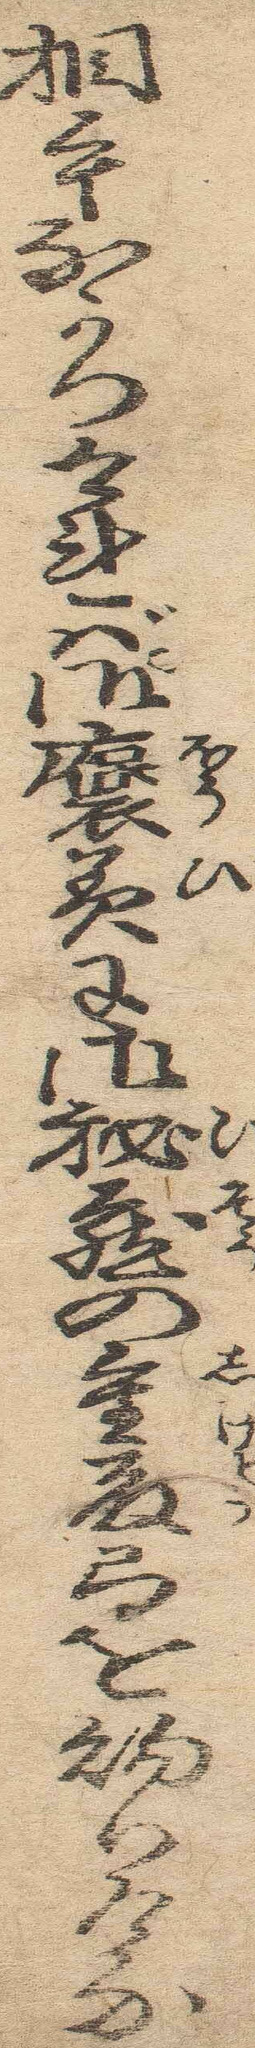相手なかるけれバ御褒美に御秘蔵の重藤弓を賜りける
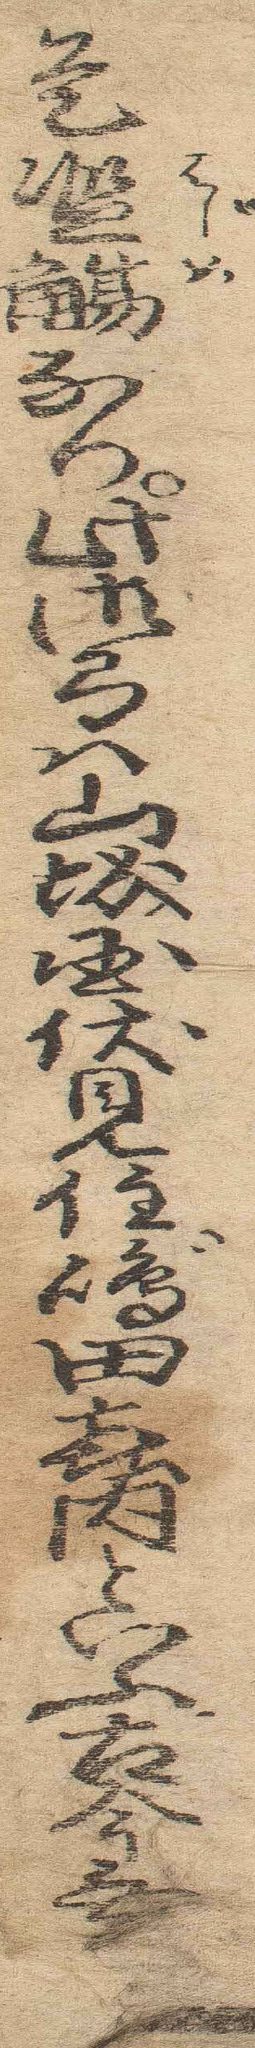是濫觴なり。此御弓ハ山城国伏見住嶋田喜内といふ古今無
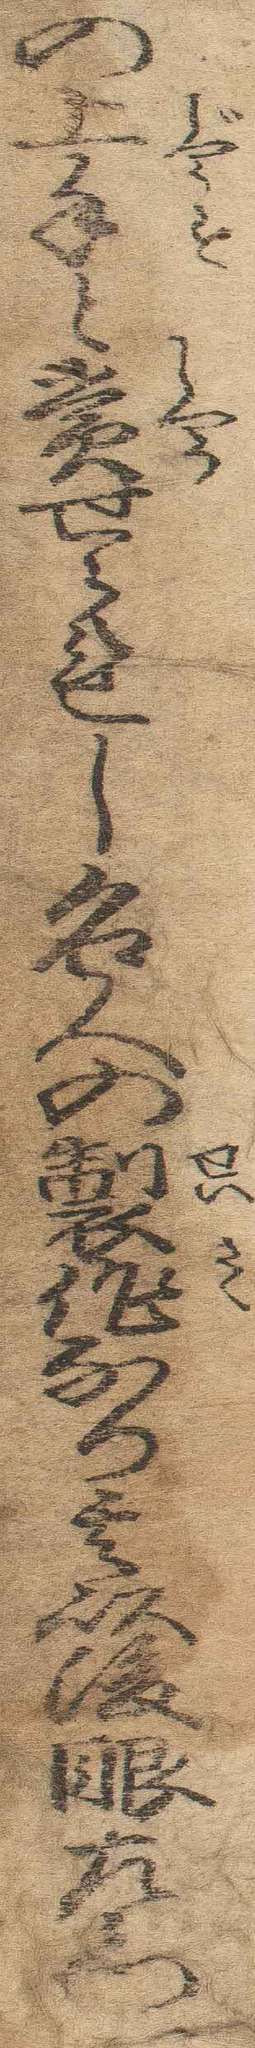の上手と賞せられし名人の製作なる其以後眼右衛門相

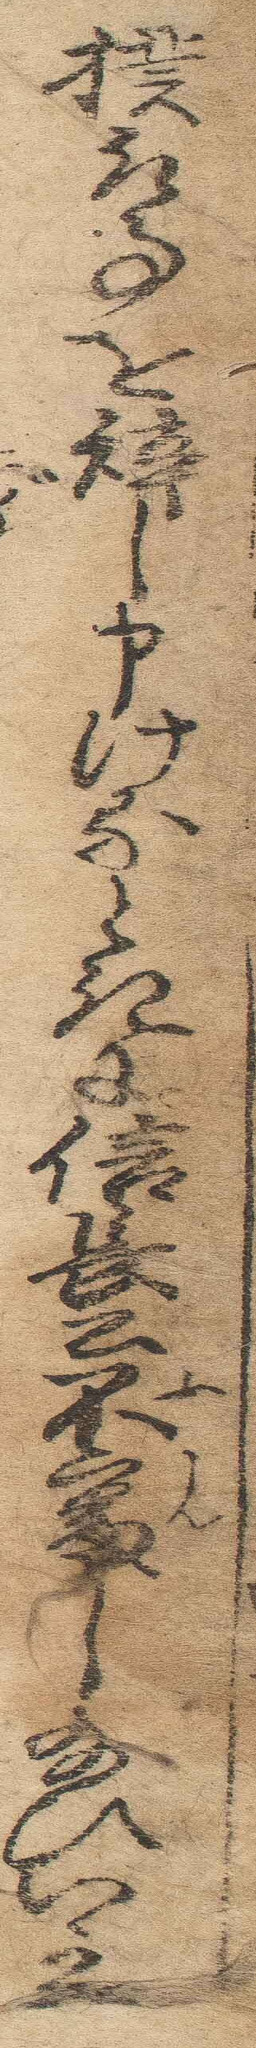撲取事梓し申けるときに信長公不審し給ひいか
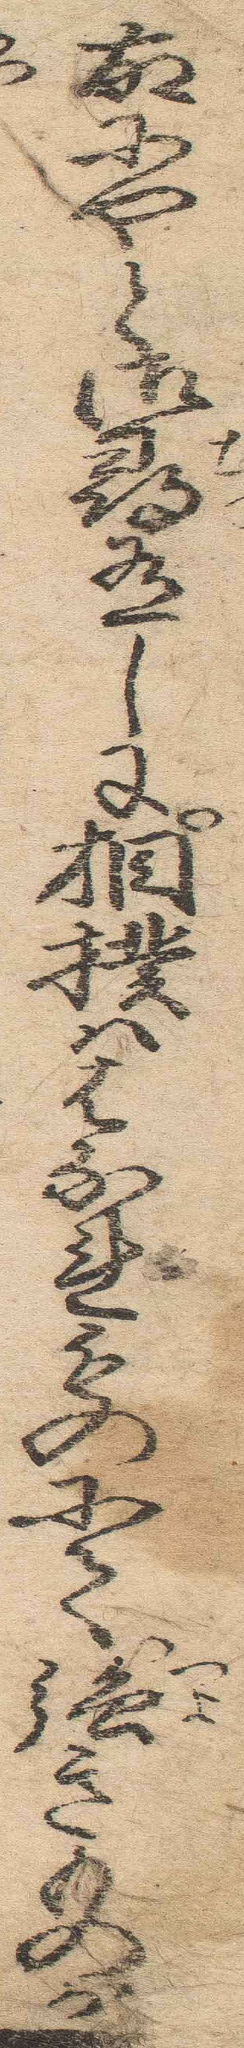故にやと御尋有しに。相撲ハはなれものにて強きものものが
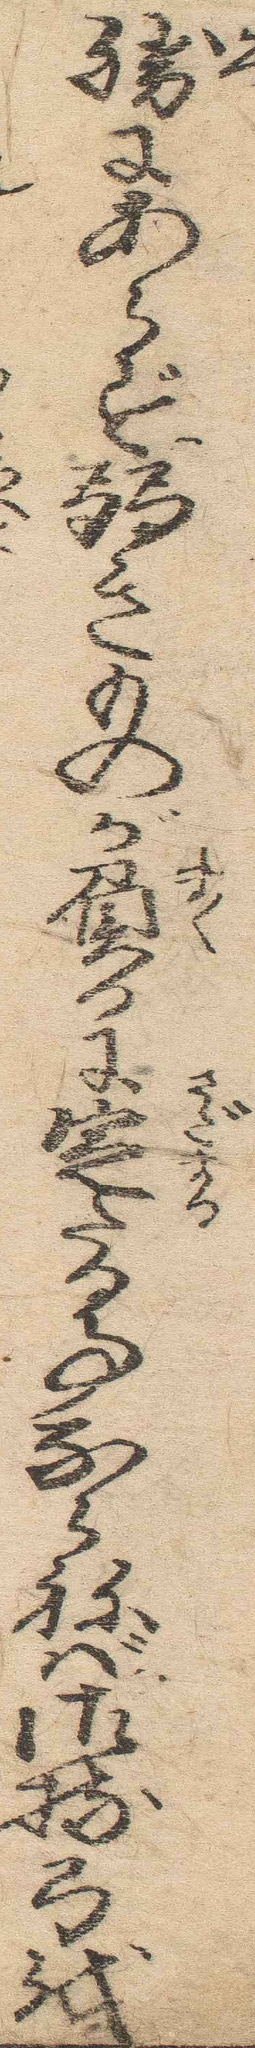勝にあらず弱キものが負るに定たる事ならねバ御持弓を
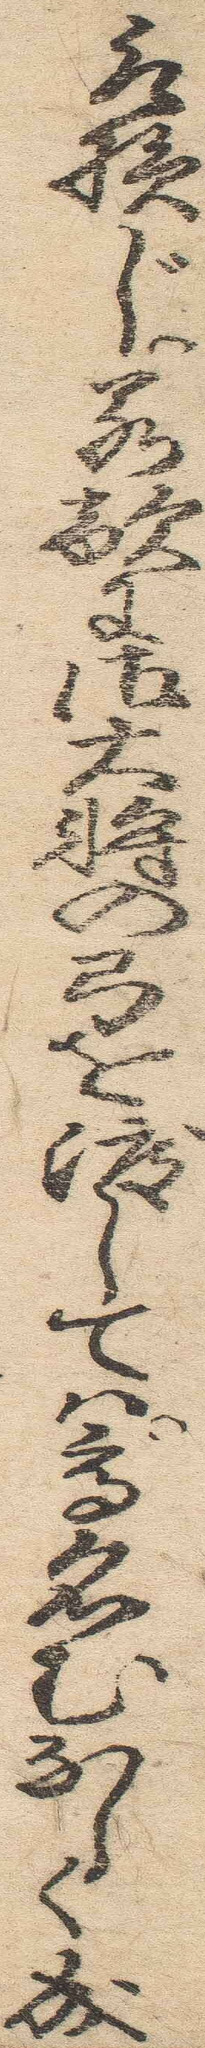取損じ。若敵に御大将の弓を渡してハ高名むなしく成
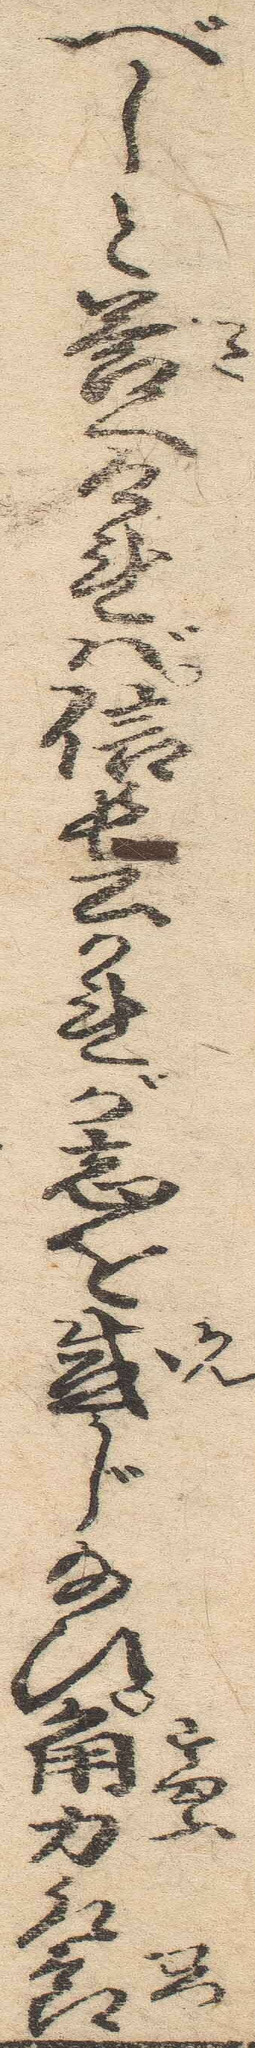べしと答へけれバ信長公かれが志を感じ給ひ。角力取節
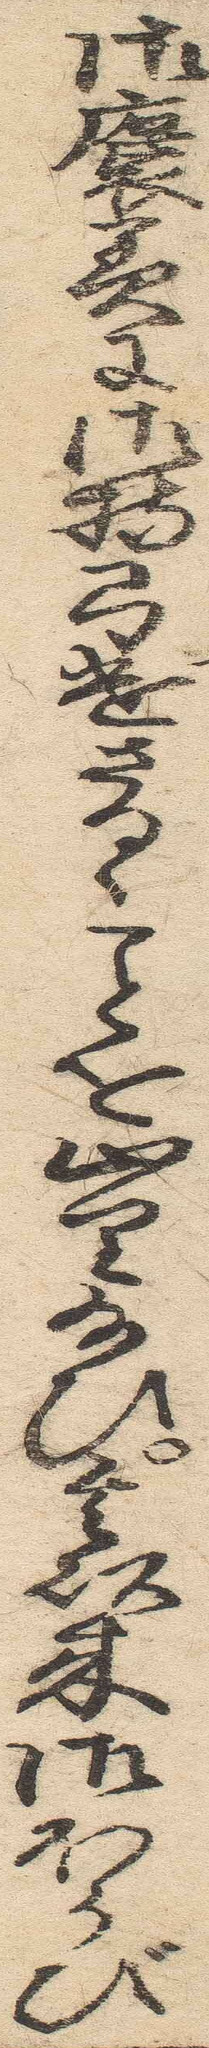御褒美に御持弓遣さることを止り給ひ其以来御ほうび
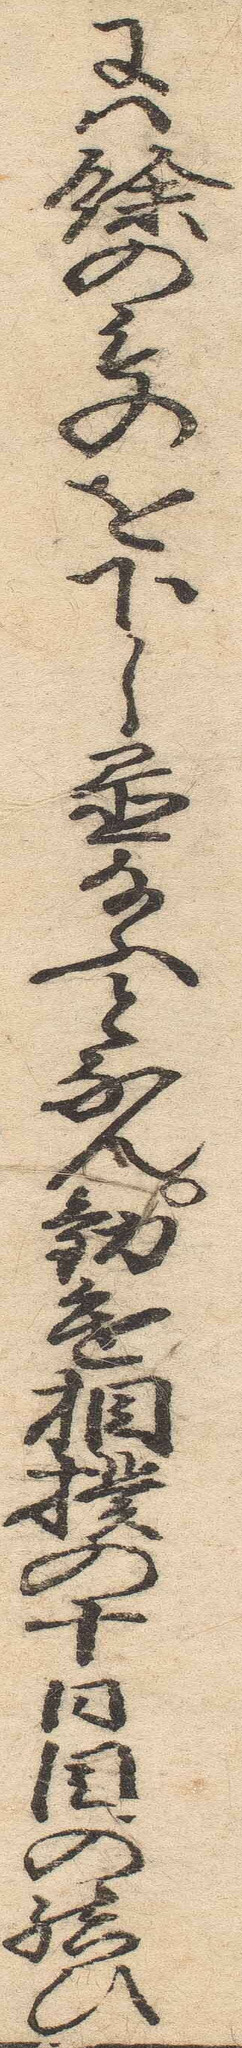にハ餘のものを下し置給ふとなん。勧進相撲の十日目の結ひ
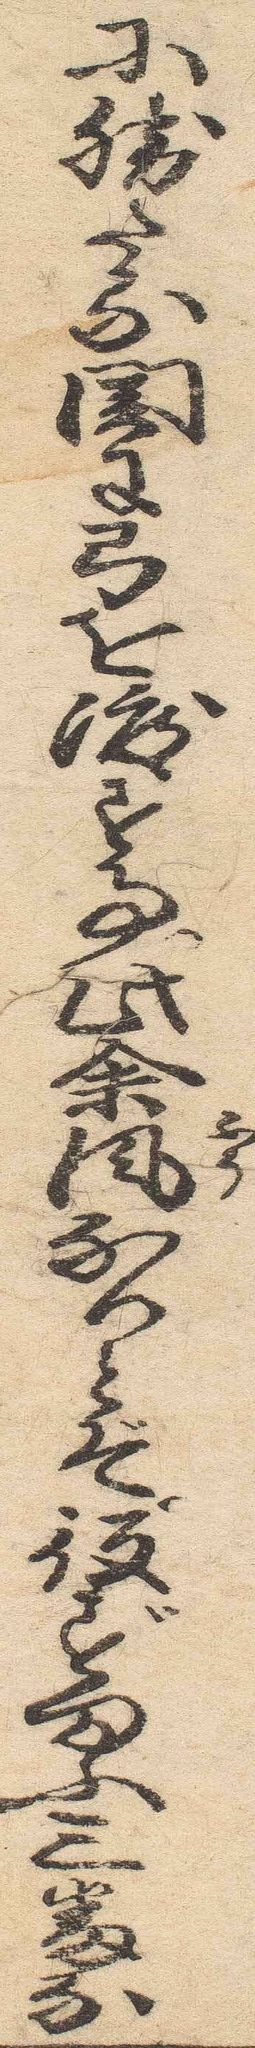に勝たる関に弓を渡す事。此余風なりとぞ。役ずまふ三番な
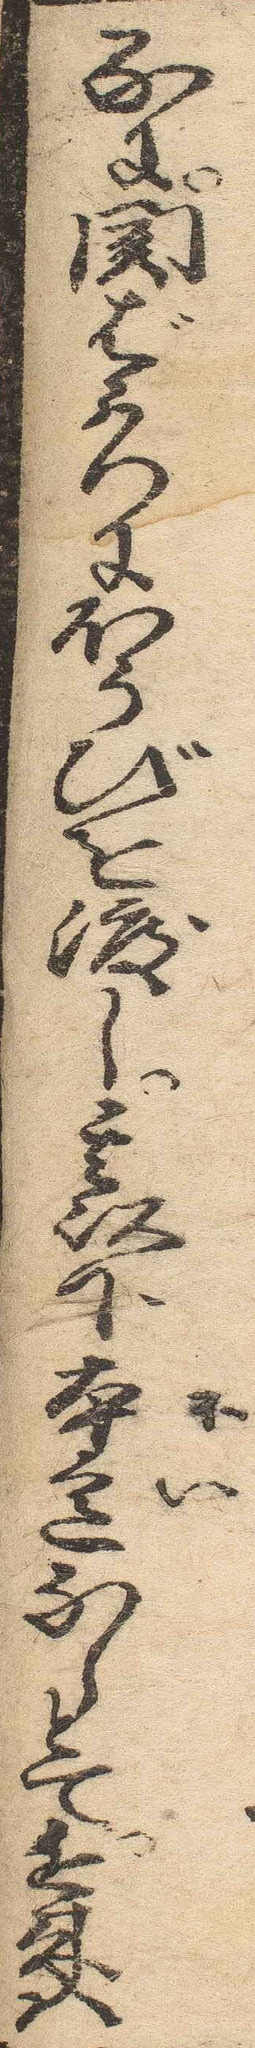るに。関ばかりにほうびを渡し。其以下本意なしとて。近来ハ
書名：古今相撲大全
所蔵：東京学芸大学附属図書館 国文学研究資料館
